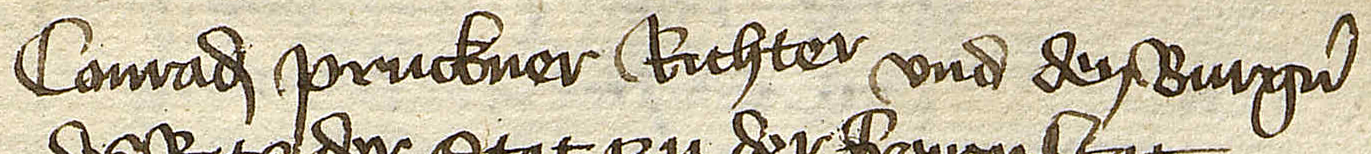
Conrad* pruckner Richter vnd den Burgn*
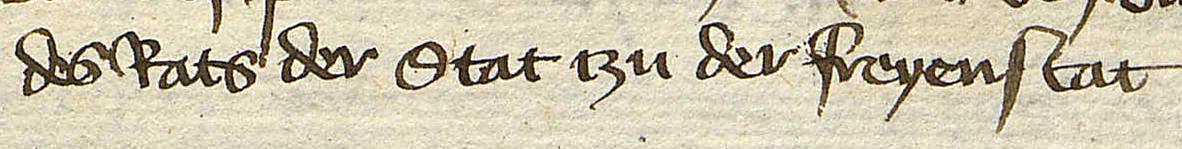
des Rats der Stat cʒu der Freyenſtat
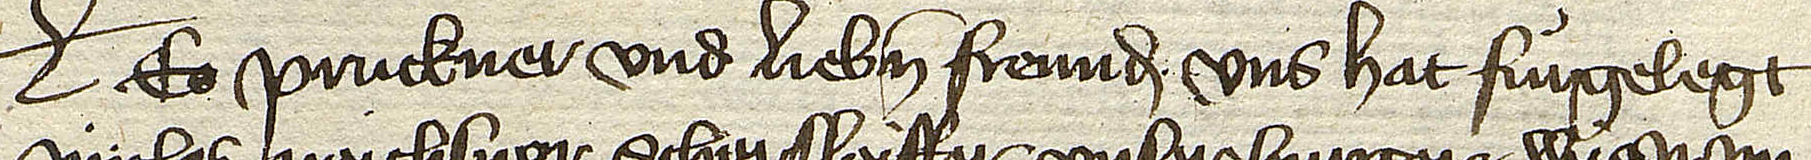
L* Co pruckner vnd liebn* freund* vns hat fürgelegt
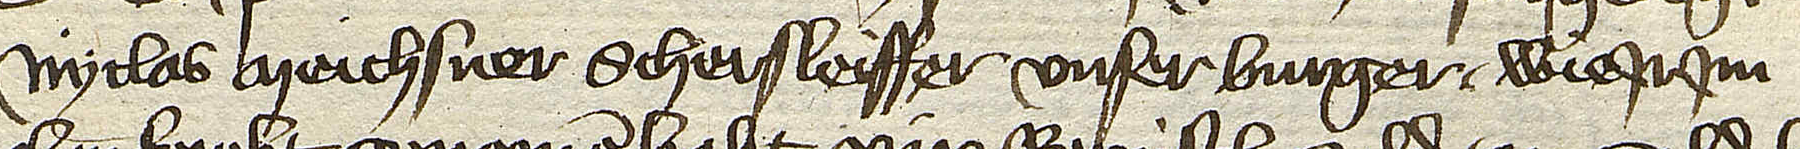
Nyclas Meichſner Scherſleiffer vnſer burger / wie Ir Im
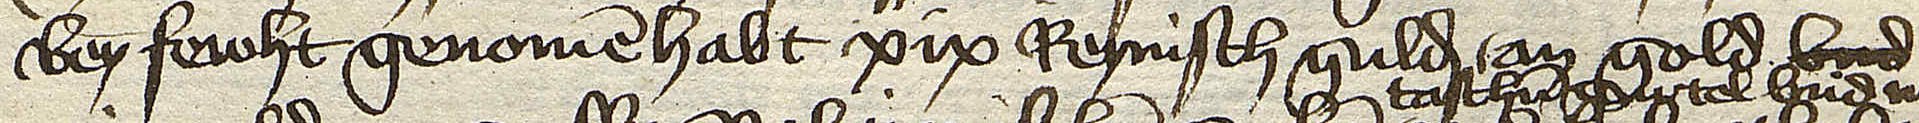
bey fewht genome* habt xix Reyniſch guld* / an gold vnd
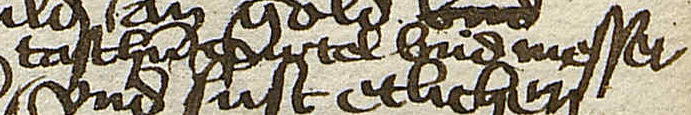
taſchn* Gurtel vnd meſſer
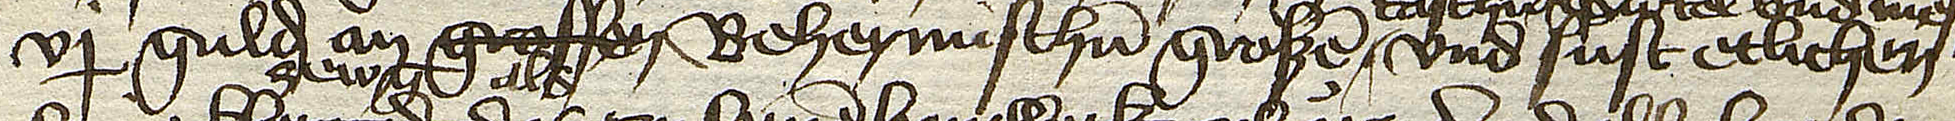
vi guld* an groſſen Beheymiſchn* groſʒe* vnd ſuſt etlichen
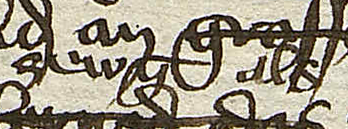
ʒewg als
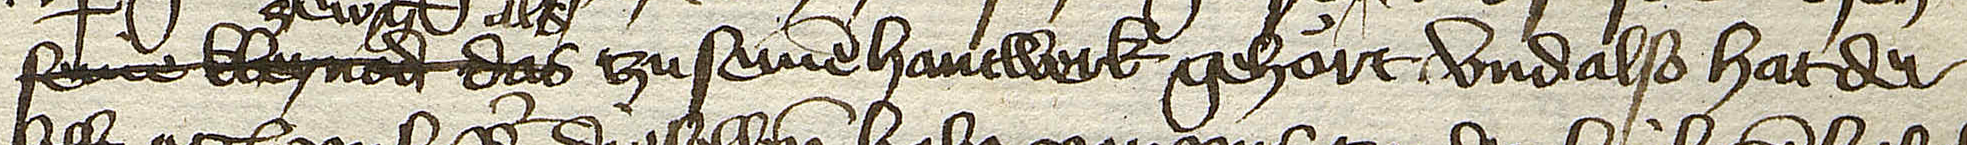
ſeine kleynod das cʒu ſeine* hantwerk gehört / vnd alſo hat der
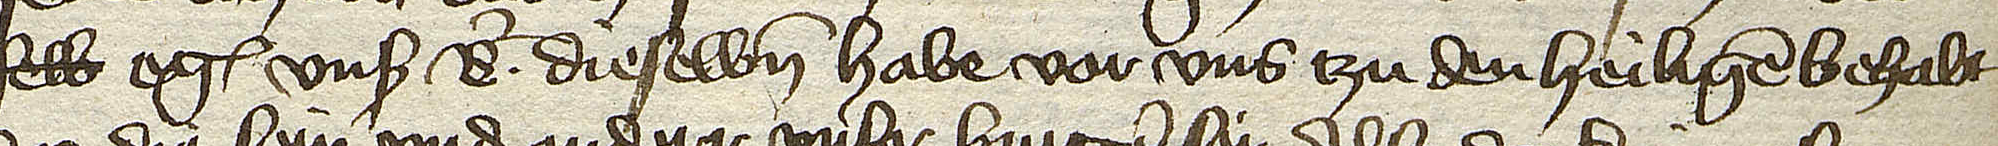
ſelb eg* vnſ* B* . dieſelbn* habe vor vns cʒu den heilige* behabt
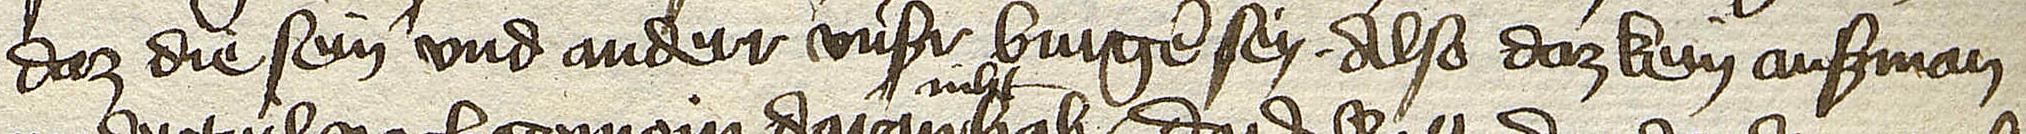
daʒ die ſein vnd anderr vnſ*r burge* ſey / Alſo daʒ kein auſʒman
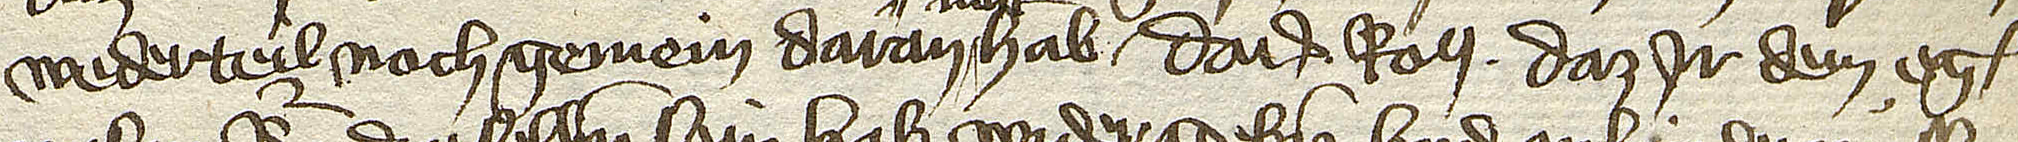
wederteil noch gemein daran hab / Dar* . Ro* . daʒ Ir dem eg*
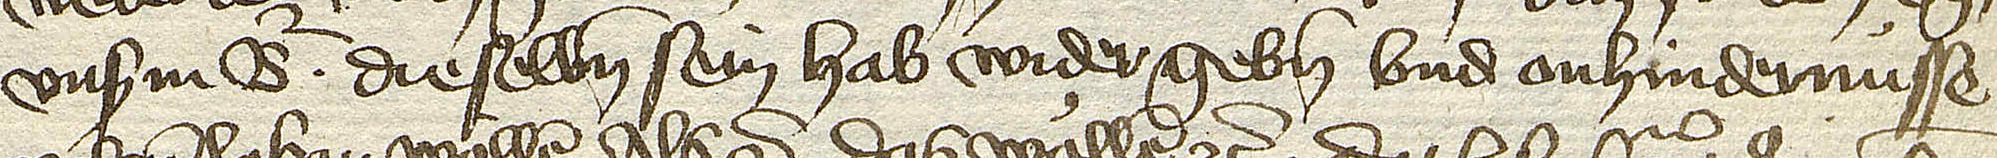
vnſ*m B* . dieſelbn* ſein hab wider gebn* vnd onhindernüſſe
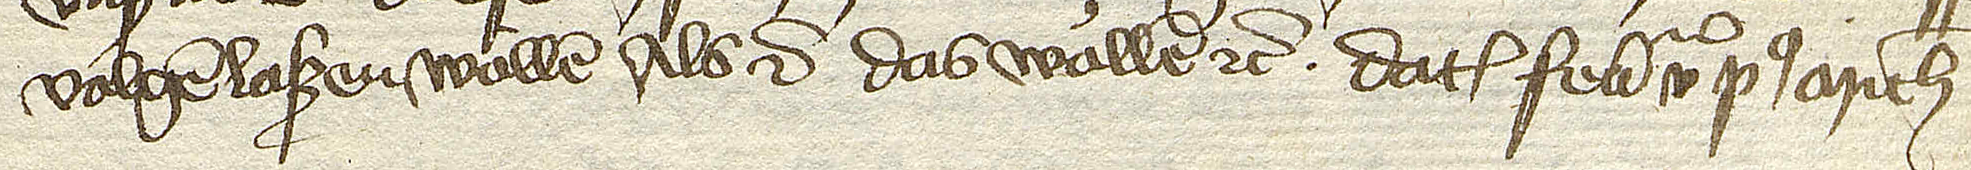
volge* laſʒen wölle* Als ec* das wölle* ec* . Dat* fea* v* p* Mich*
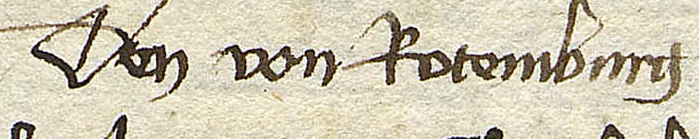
Den von Rotemburg
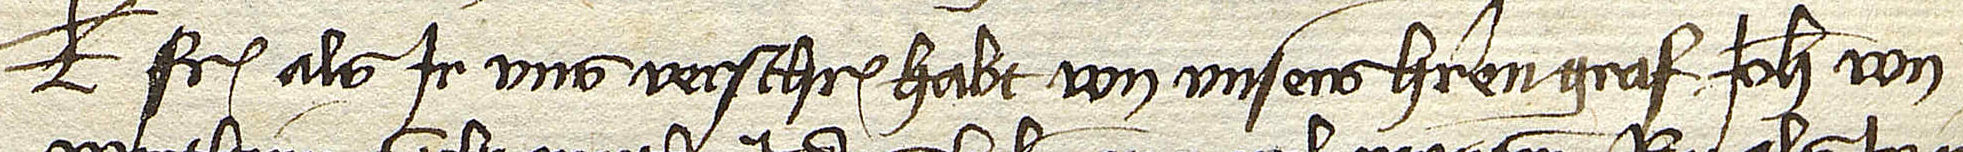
L* fr* als Ir vns verſchr* habt von vnſers h*ren graf Ioh* von
